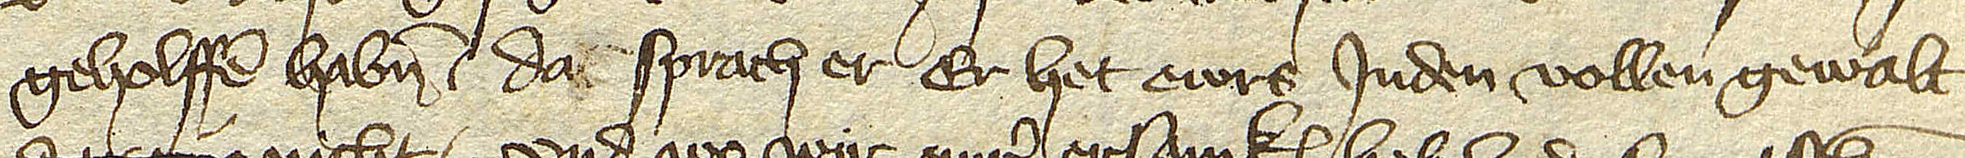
geholffe* habn* / da ſprach er Er het ewrs Iuden vollen gewalt
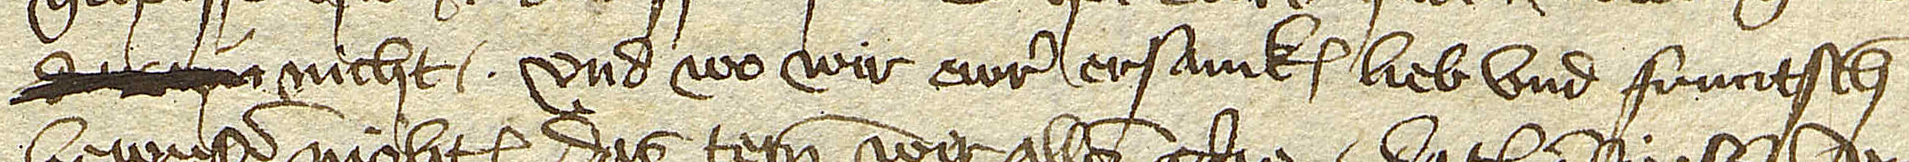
d%%y% nicht / . vnd wo wir ewr* erſamk* lieb vnd fruntſch*
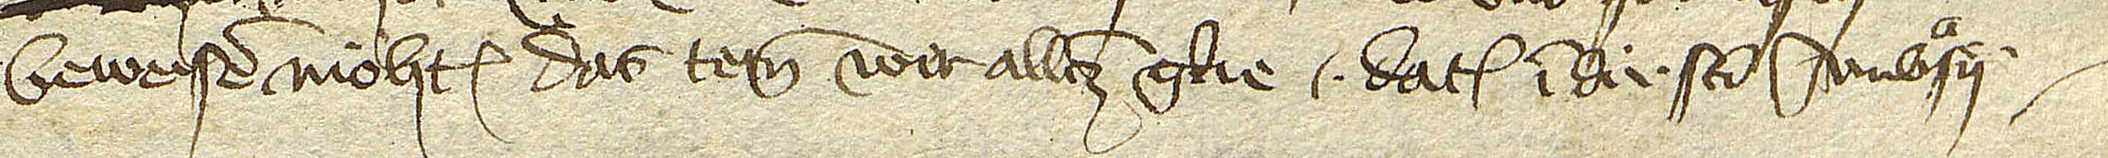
beweiſe* möht* das tetn* wir allcʒ* g*ne / . dat* i* die ſci* Amb*ſii* /
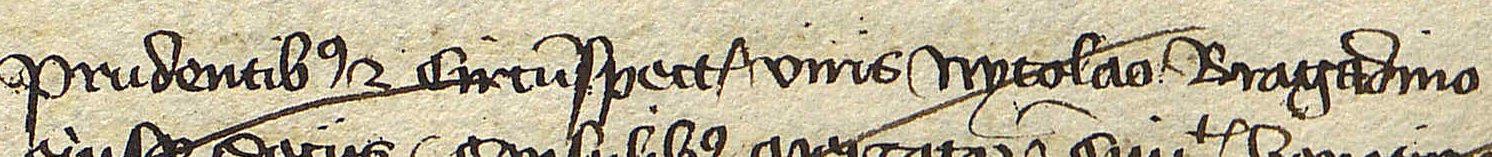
Prudentib* @ Circu*ſpect* viris Nycolao Bragadino
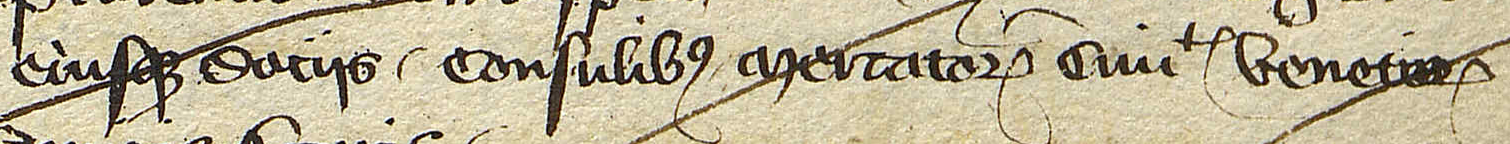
eiuſq* Sociis Conſulib* Mercator* Ciui*t* Venetia*
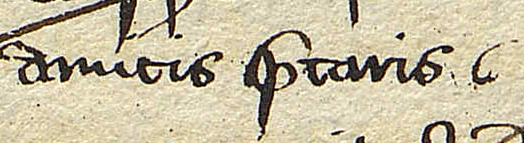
Amicis p*caris /
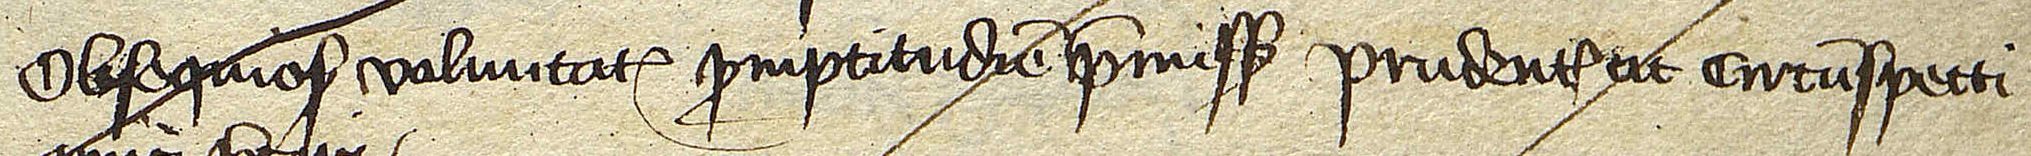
Obſequios* voluntat* p*mptitudi*e p*miſſ* prudent* ac Circu*ſpecti
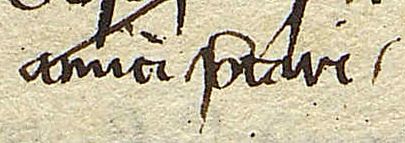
amici p*cari /
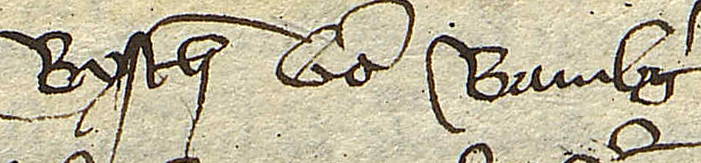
Byſch* vo* Bambg*
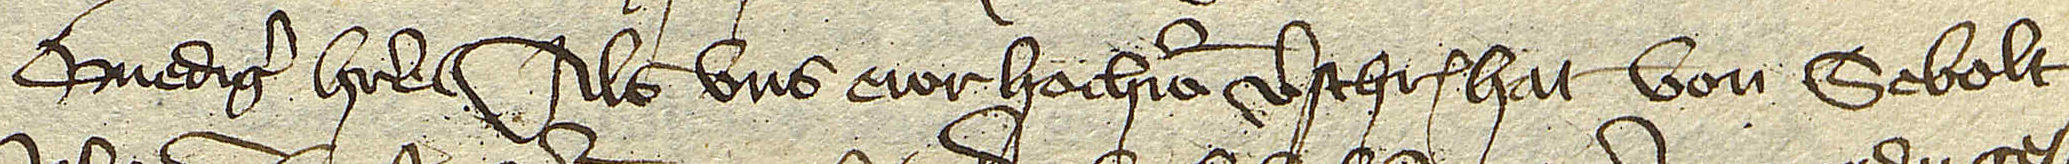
Gnedig* hr*e / Als vns ewr hochw* v*ſchr* hat von Sebolt
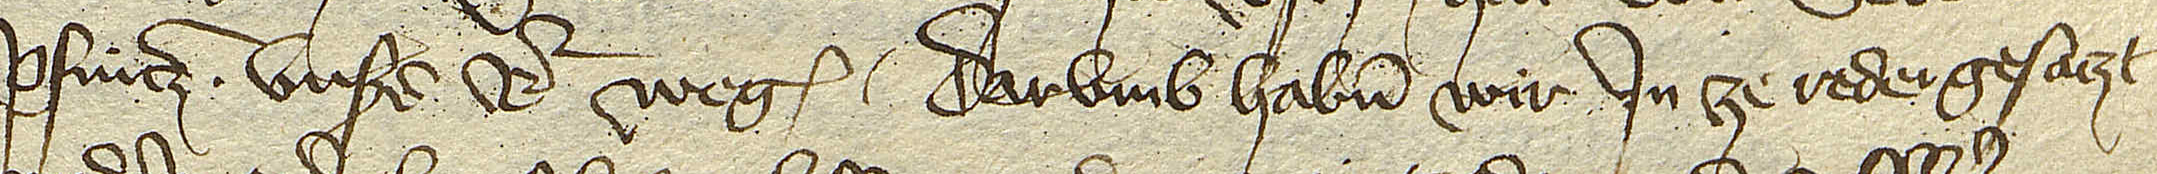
Pfincʒ* . vnſ*s B* weg* / Darvmb habn* wir In cʒe rede geſacʒt
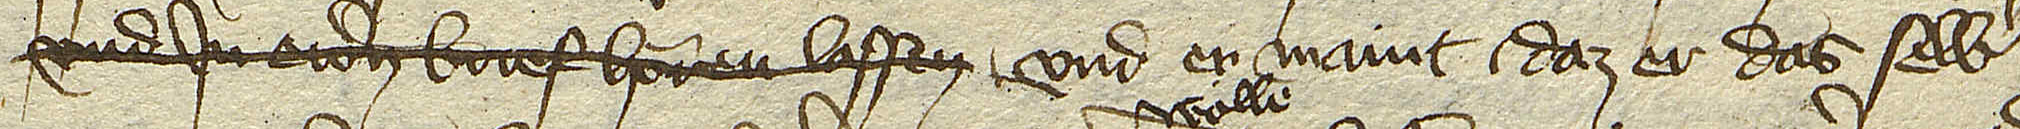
vnd In ew*n brief hören laſſen / vnd er maint / daʒ er das ſelb*
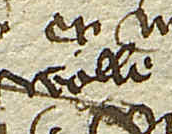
wölle
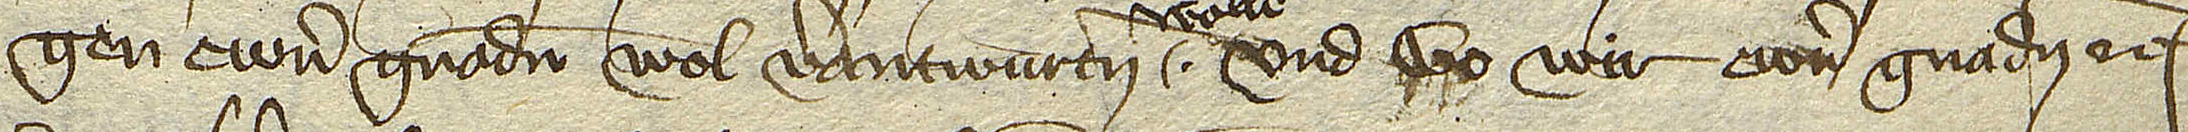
gen ewn* gnadn* wol v*antwurtn* / . vnd wo wir ewn* gnadn* ec*
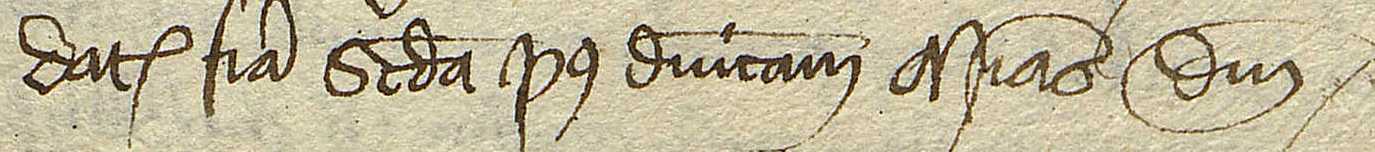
dat* fia* Scda* p* dnicam* a* Mias* dm* /
